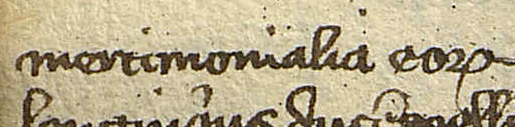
mercimonialia eo*
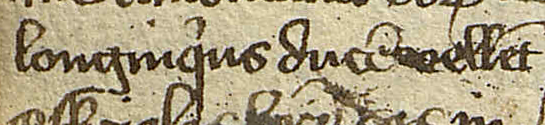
longinq*us duce* velle*t
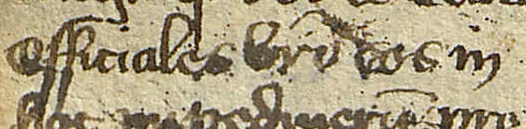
officiales v*ri eos in
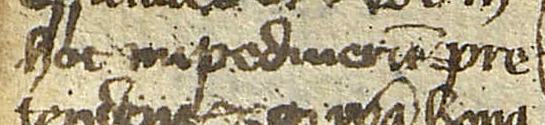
hoc impediuer*t pre
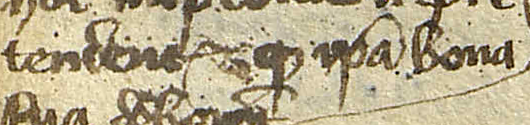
tendent* q* ip*a bona
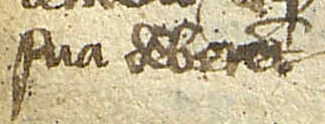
ſua debere*t
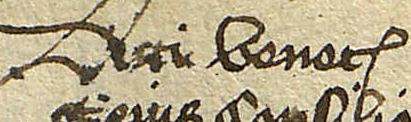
Duci Venet*
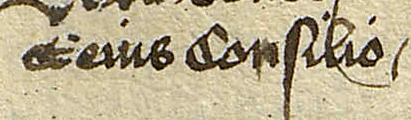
et eius Conſilio /
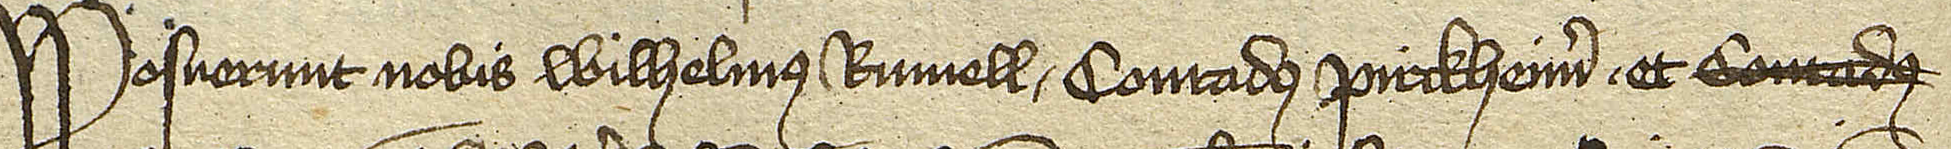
P*poſuerunt nobis Wilhelm* Rumell / Conrad* Pirckheim* / et Conrad*
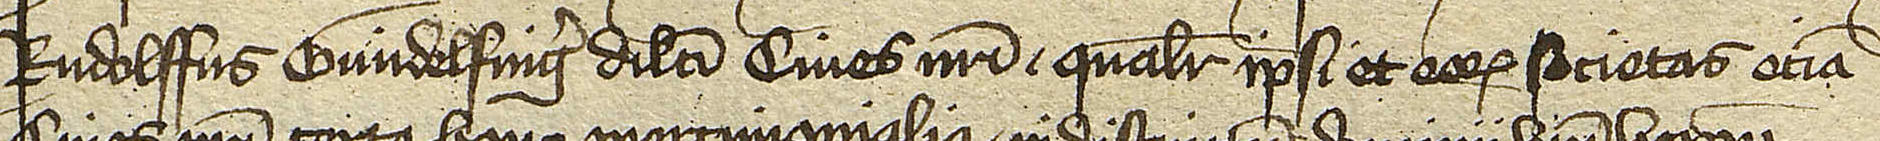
Rudolffus Gundelfing* dil*i Ciues n*ri / qual*r ipſi et eo* ſocietas etia*
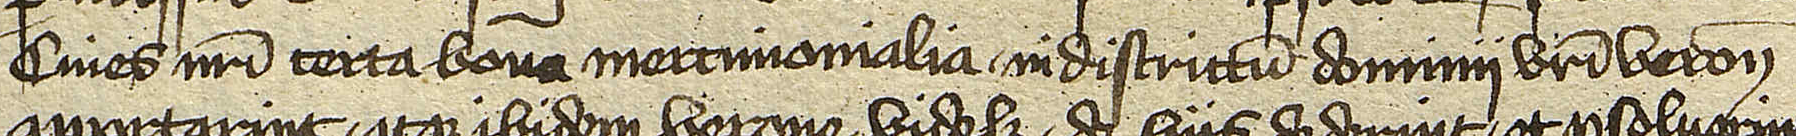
Ciues n*ri certa bona mercimonialia / in diſtrictu* dominii v*ri Veron*
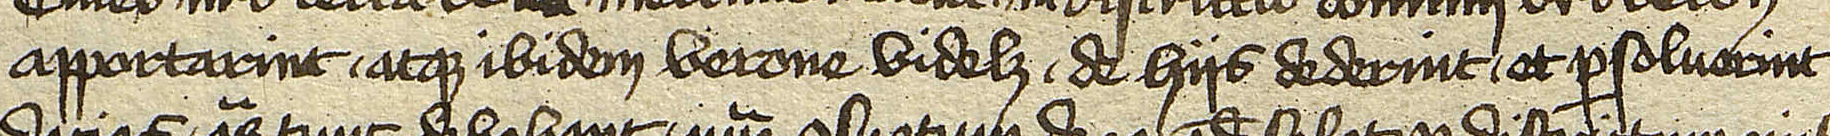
apportarint / atq* ibidem Verone videl* / de hiis dederint / et p*soluerint
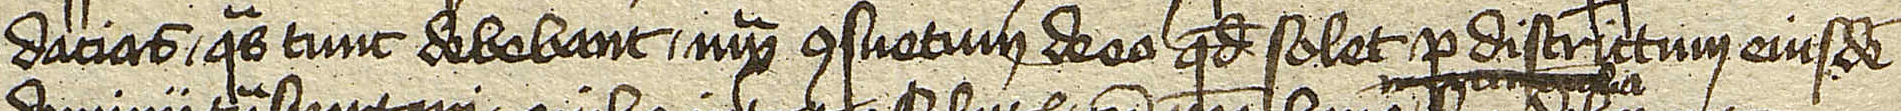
dacias / q*s tunc debebant / iux* *ſuetum de eo q*d ſolet p* diſtrictum eiuſde*
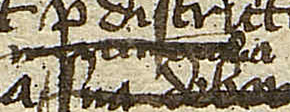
mertimonialia
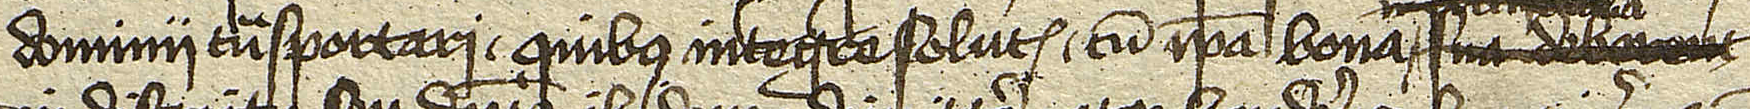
dominii t*nſportari / quib* integre ſolut* / cu* ip*a bona ſua deberent
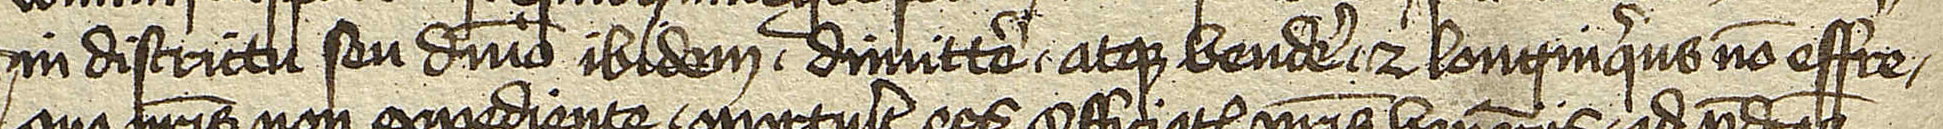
in diſtrictu ſeu d*nio ibidem / dimitte* / atq* vende* / @ longinqu*s no* eff*re /
